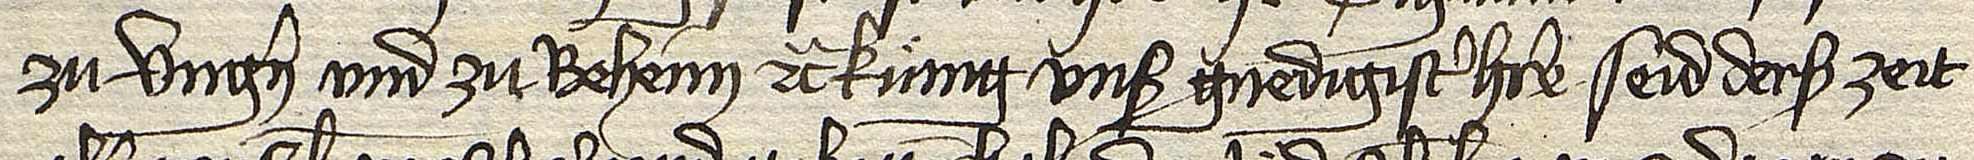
ʒu Vng*n vnd ʒu Beheim ec* künig vnſ* gnedigiſt* h*re ſeid derſ* ʒeit
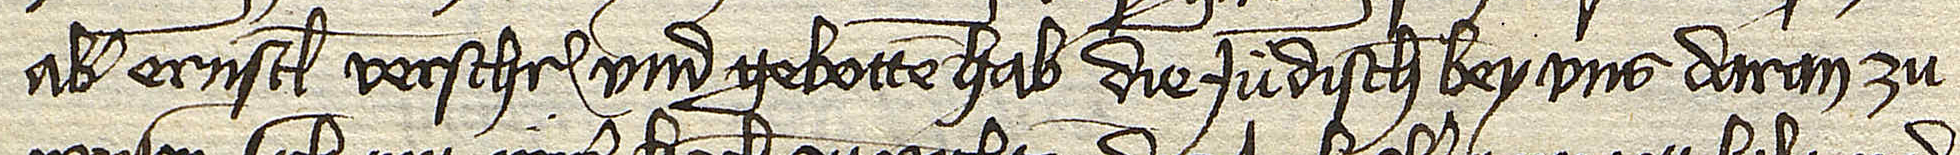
ab* ernſtl* verſchr* vnd gebotte* hab die Iüdiſch* bey vns daran ʒu
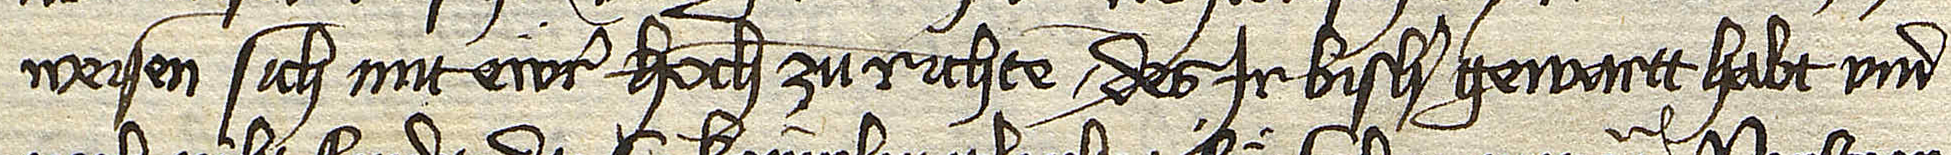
weiſen ſich mit eẅr* hoch* ʒu richte* / des Ir biſh* gewartt habt vnd
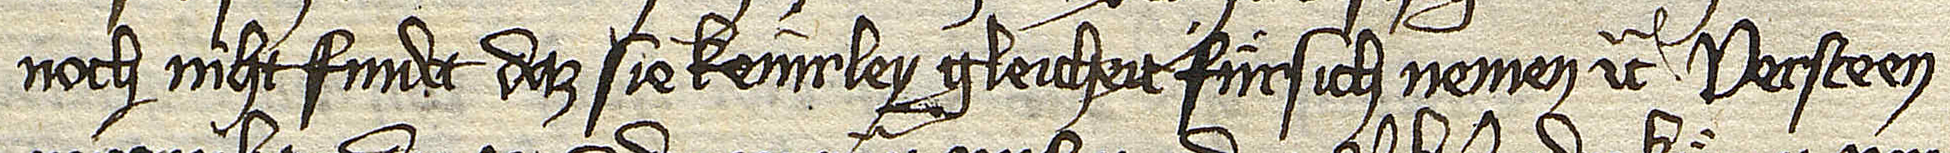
noch niht findet daʒ ſie keinrley gleicheit für ſich nemen ec* . Verſteen
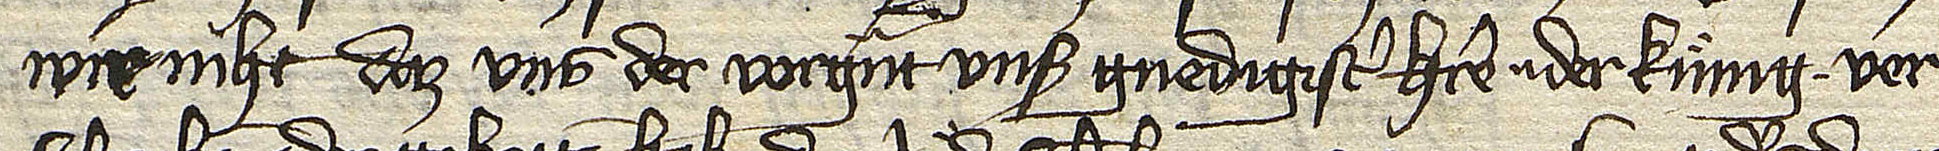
wie niht daʒ vns der vorgnt* vnſ* gnedigiſt* h*re ~ der künig . ver
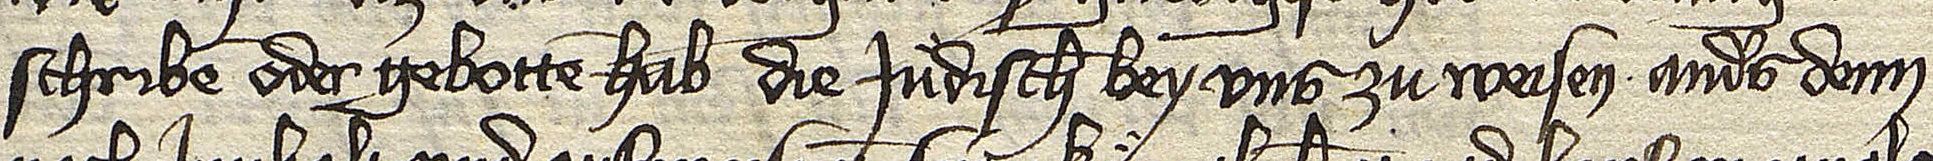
ſchribe* oder gebotte* hab die Iüdiſch* bey vns ʒu weiſen . and*s denn
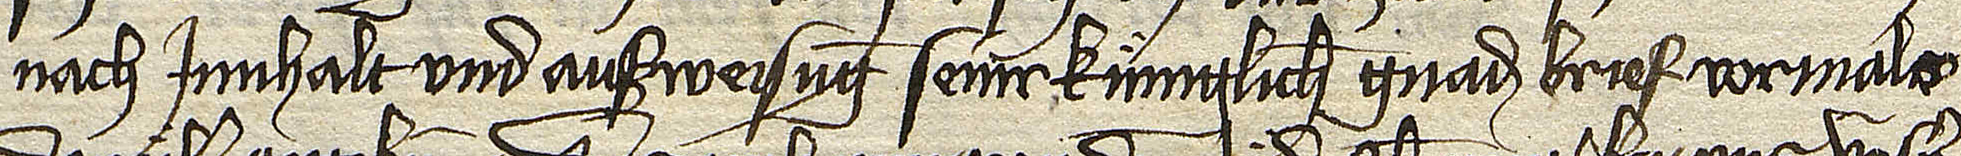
nach Innhalt vnd auſʒweiſu*g ſeinr küniglich* gnad* brief vormals
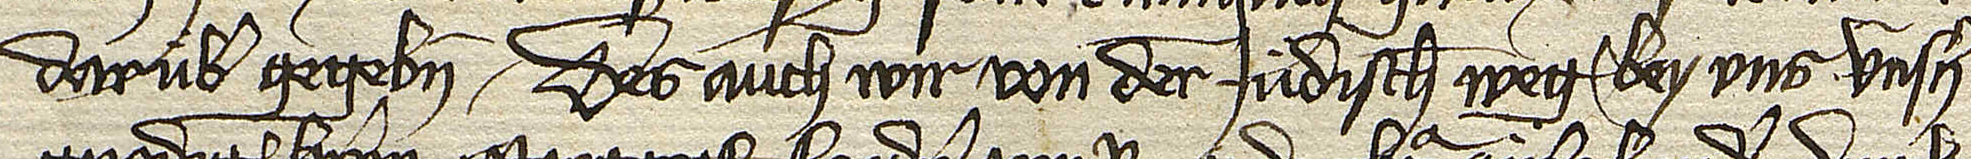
darüb* gegebn* / Des auch wir von der Iüdiſch* weg* bey vns Vnſn*
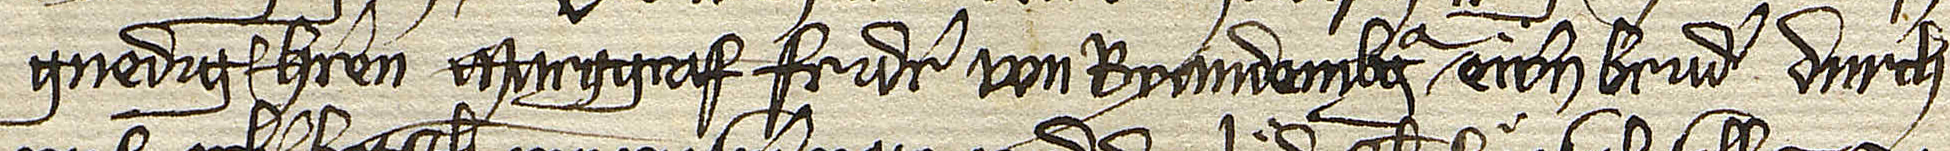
gnedig* h*ren Marggraf fridr* von Brandemb*g / eẅ*n brud* durch
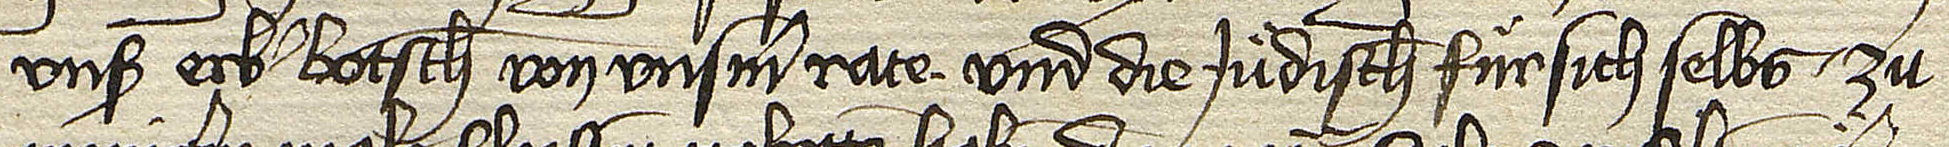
vnſ* erb* botſch* von vnſm* rate . vnd die Iüdiſch* für ſich ſelbs / ʒu
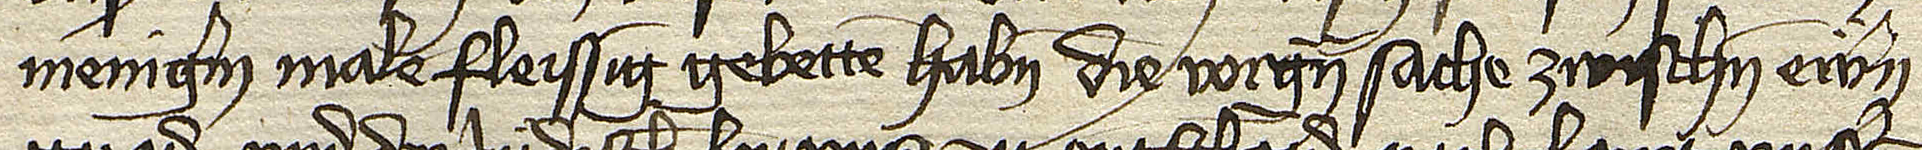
menig*m male fleiſſig gebette* habn* die vorgn* ſache ʒwiſchn* eẅ*n
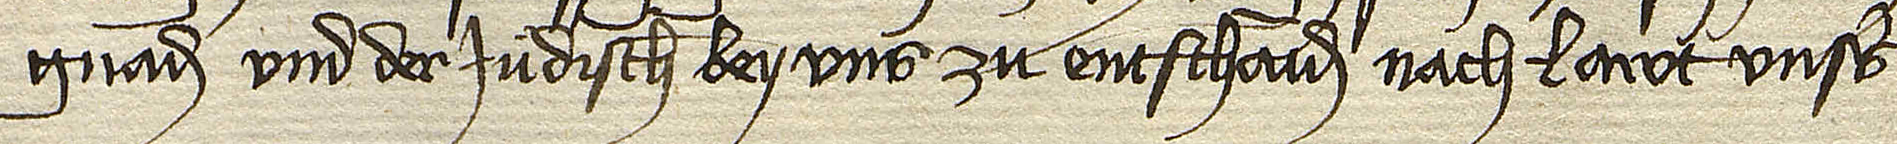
gnad* vnd der Iüdiſch* bey vns ʒu entſchaid* nach lawt vnſ*s
